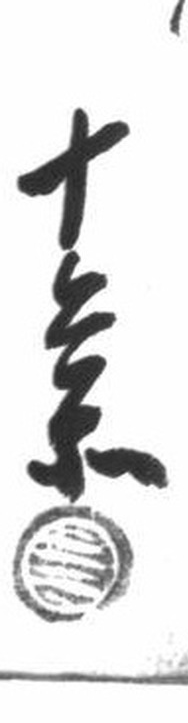十兵衛
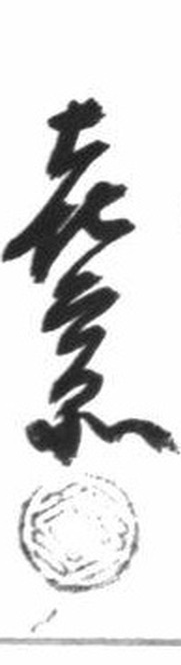喜兵衛
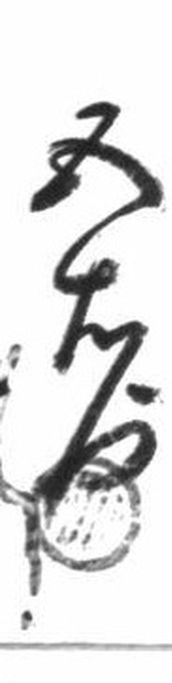五右衛門
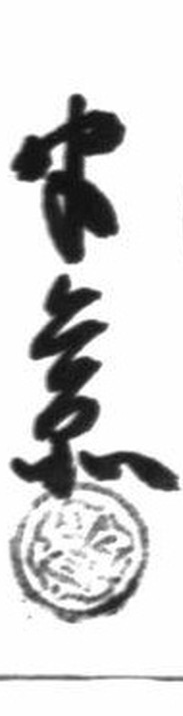半兵衛
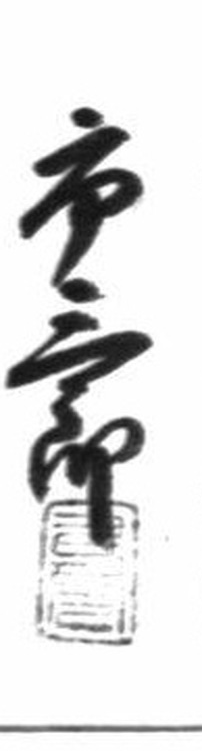市三郎
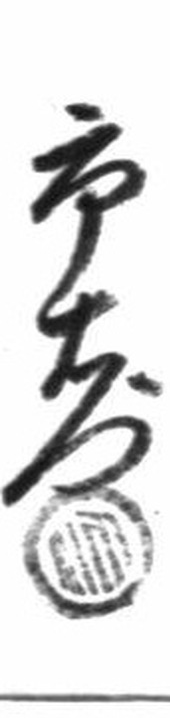市右衛門
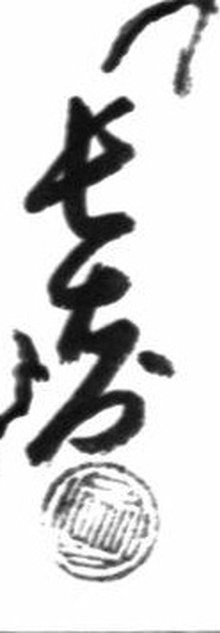仁兵衛
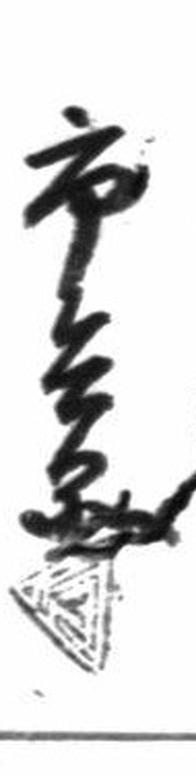市兵衛
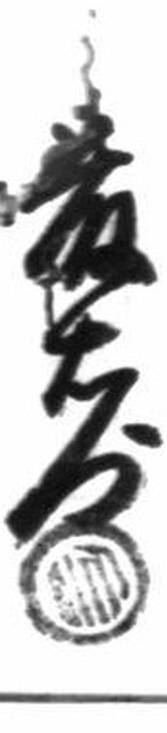藤右衛門
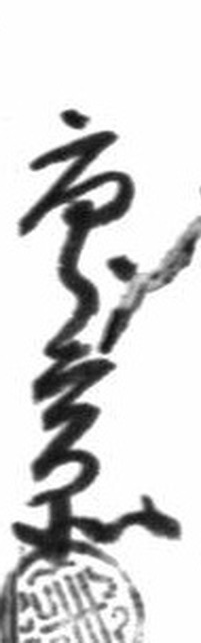市郎兵衛
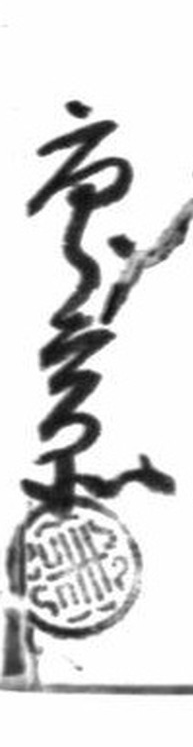市郎兵衛
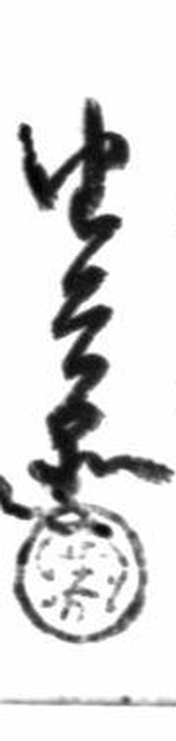仁兵衛

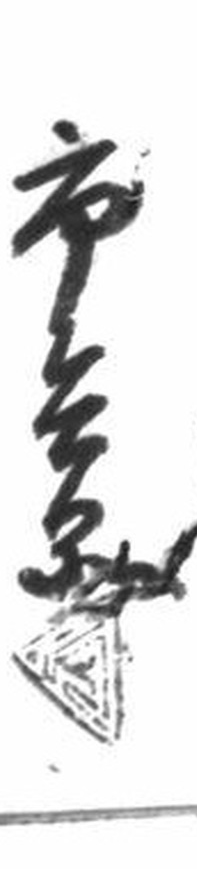由兵衛
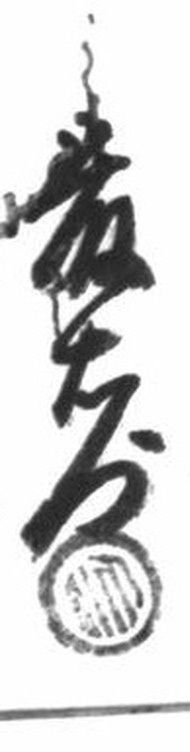安右衛門
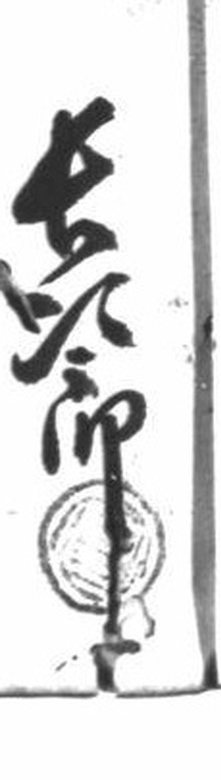長次郎
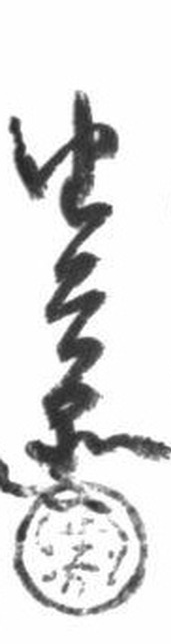由兵衛
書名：宝永弐酉五月火之用心護摩之灰御改帳証文
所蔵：福井県文書館 Fukui Prefectural Archives
